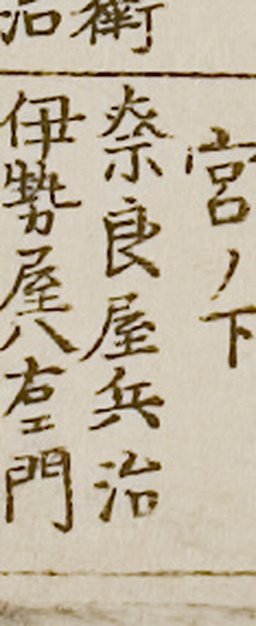奈良屋平治
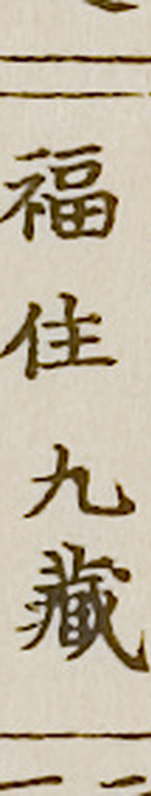福住九蔵
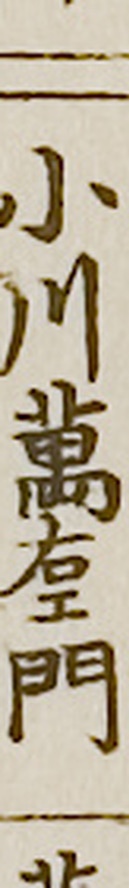小川万右エ門
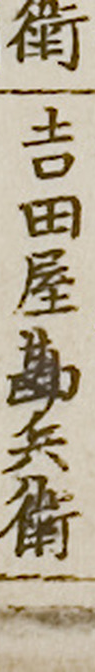吉田屋勘兵衛
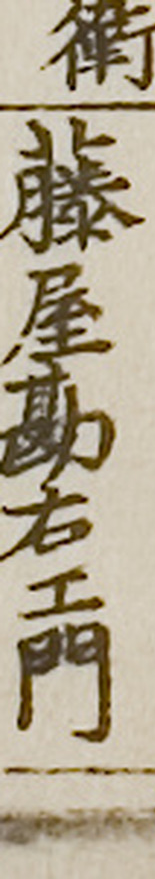藤屋勘右エ門
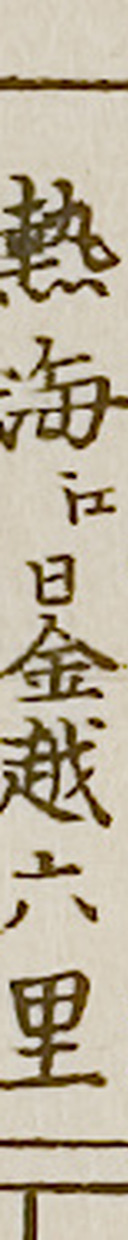熱海江日金越六里
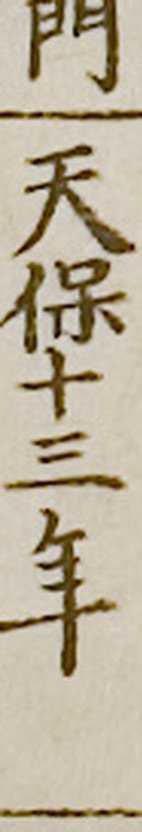天保十三年
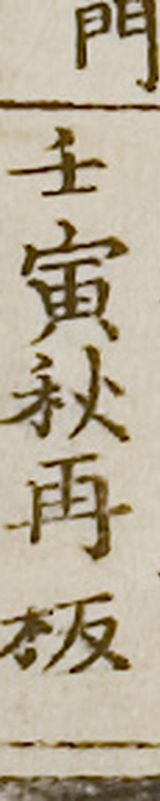壬寅秋再板
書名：[箱根温泉図]
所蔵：東京大学総合図書館 General Library in the University of Tokyo, JAPAN
